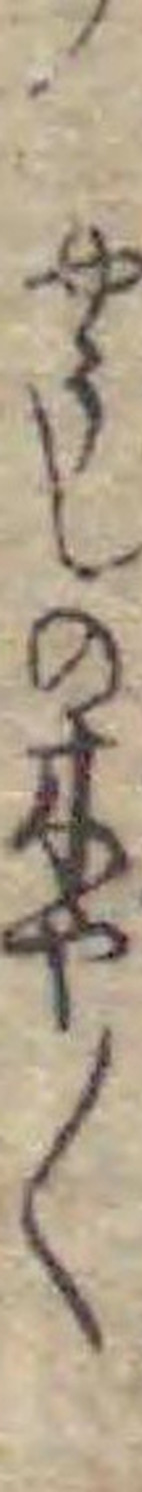やうしの木や〳〵
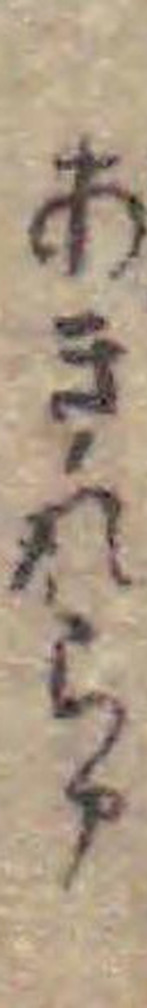あきれらァ
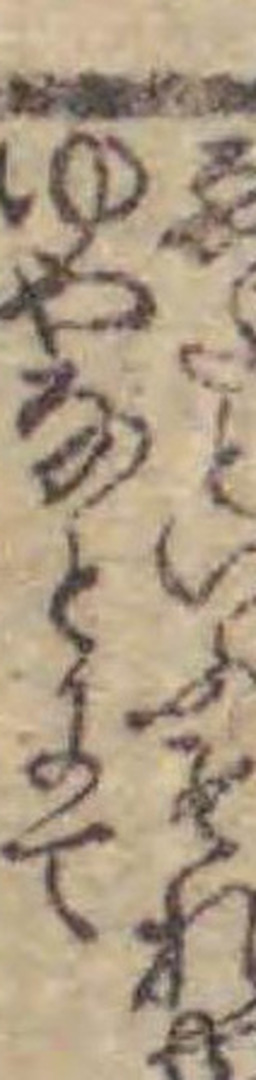ゆやなとにて
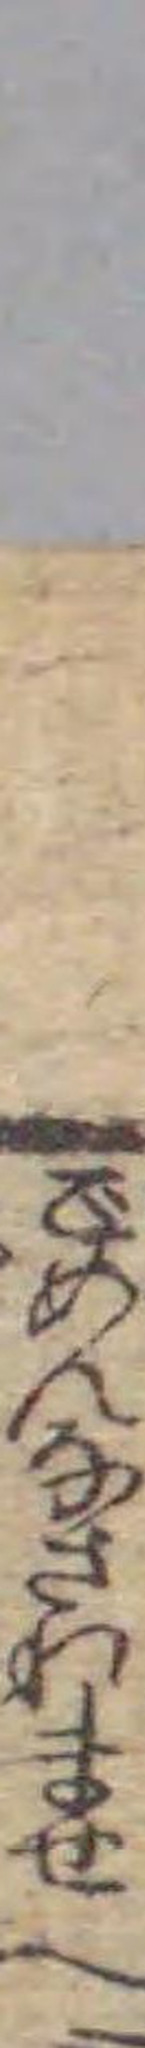ごめんなされませ
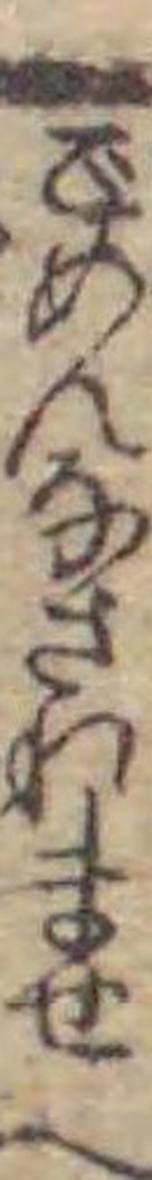ごめんなされませ
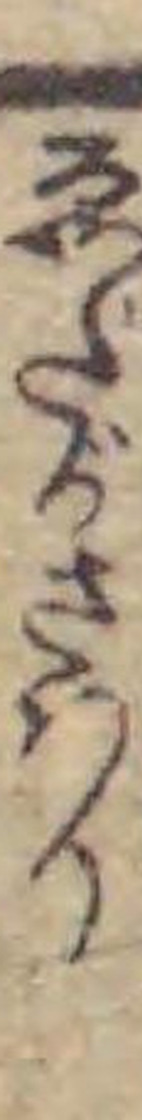ゑだがさはり

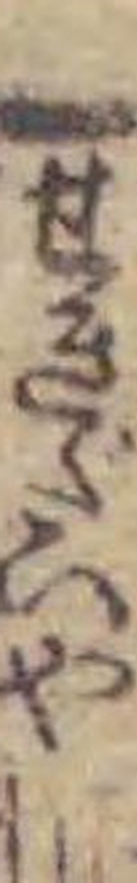せきだいや
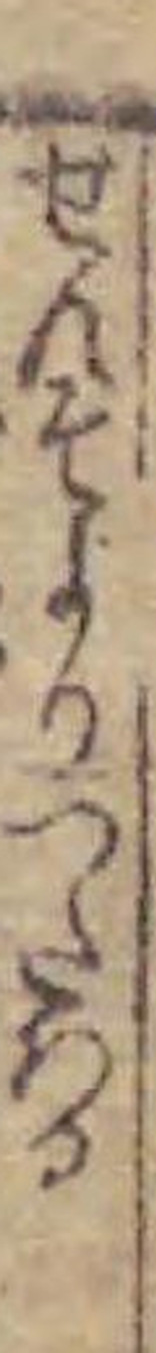せんそよりつたはる
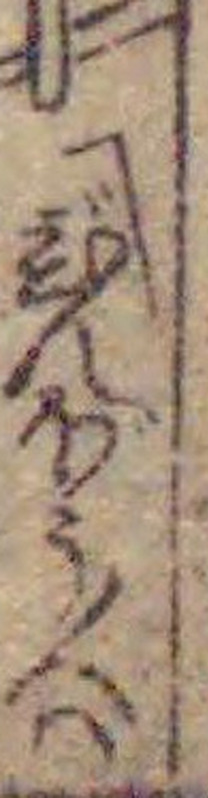〽ひんぼうな
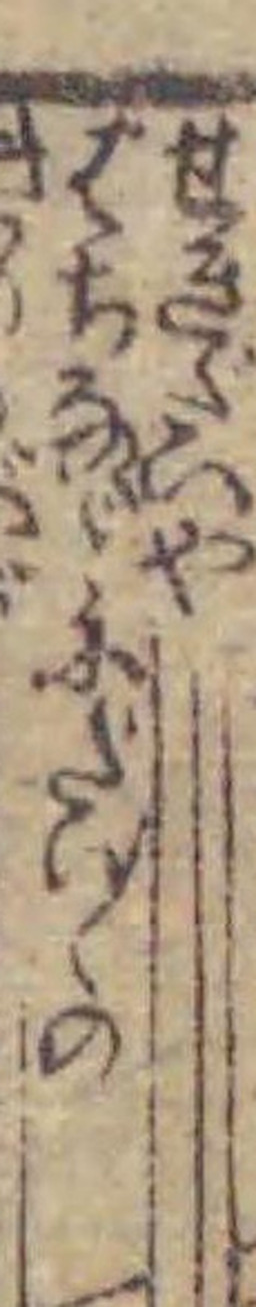やちなどにだい〳〵の
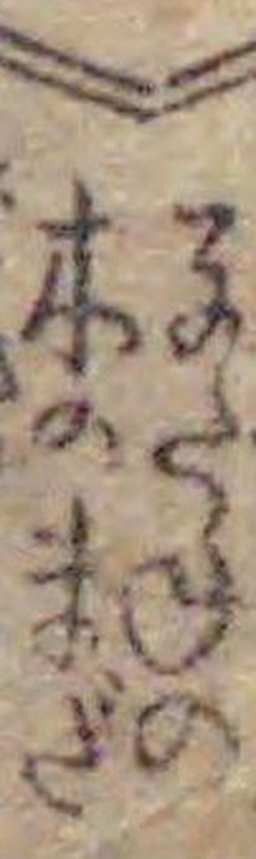木のまだ
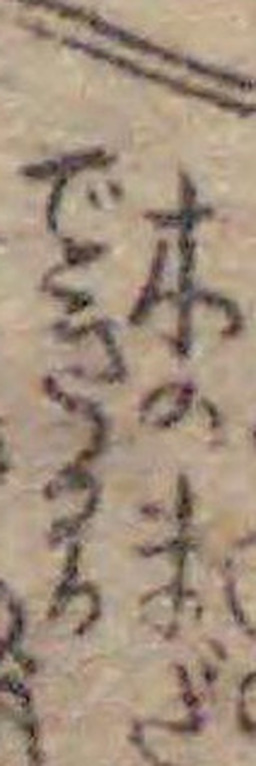できるか
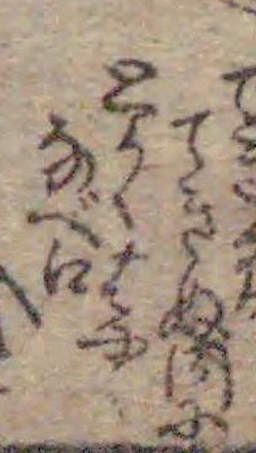とかくはなく
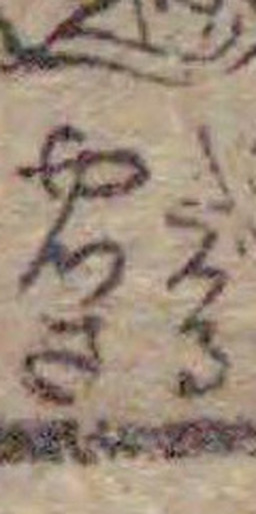やつさ
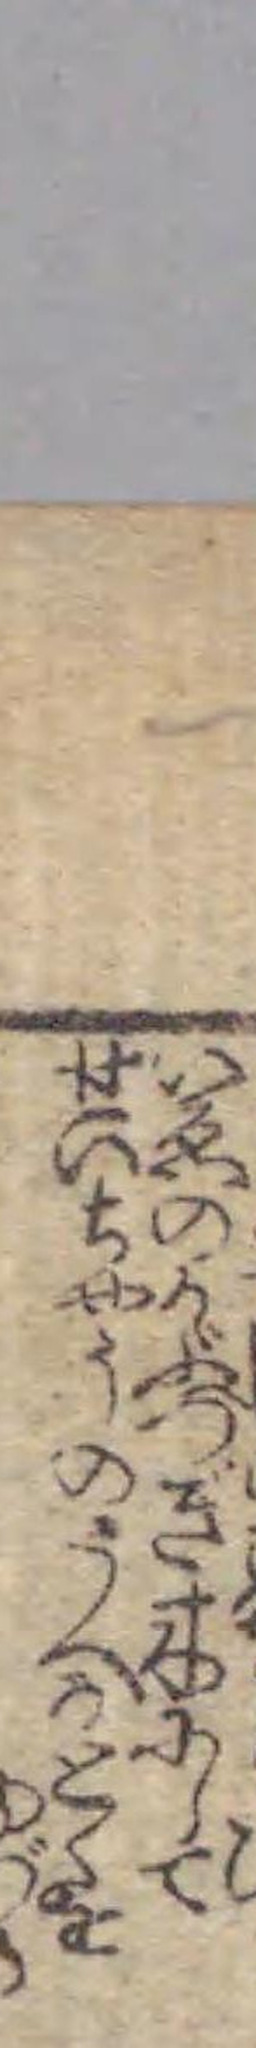せいちやうのうへかとくを
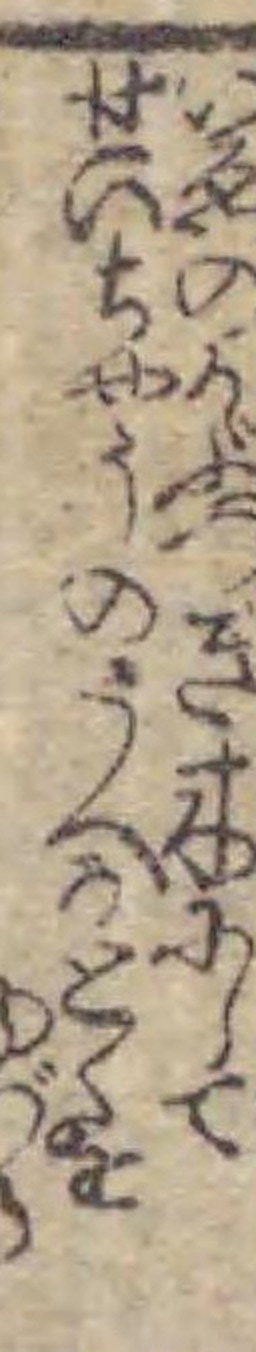せいちやうのうへかとくを
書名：奇妙頂礼胎錫杖 : 3巻
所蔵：国立国会図書館 National Diet Library, JAPAN
